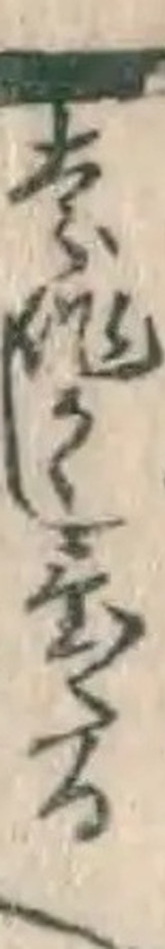太郎作かくし置たる
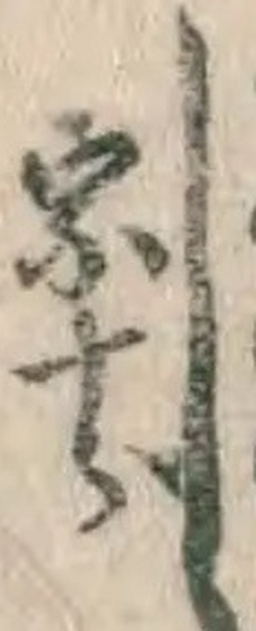宗十郎
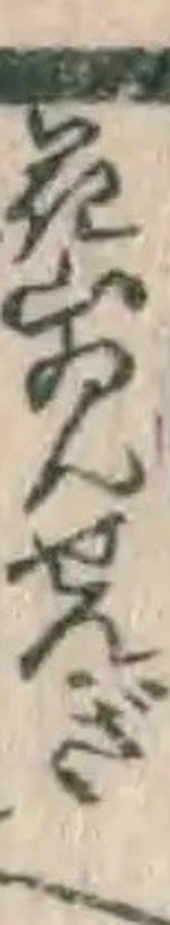花山ゐんせんぎ
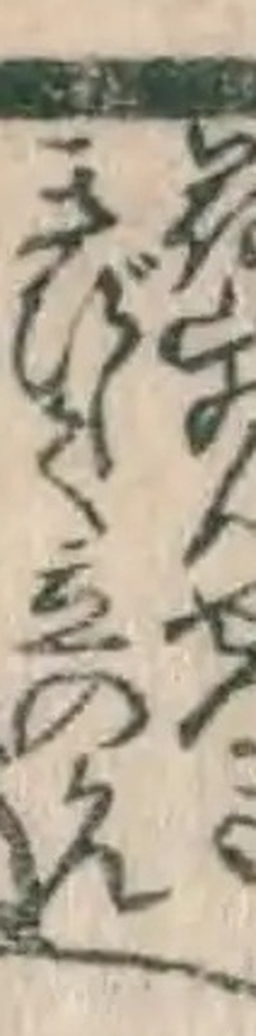きびしく立のかん
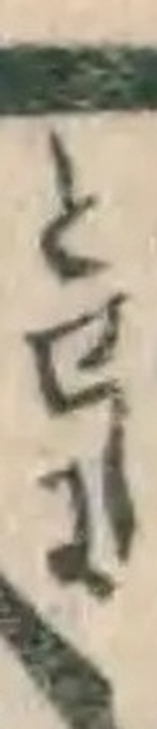とせしに
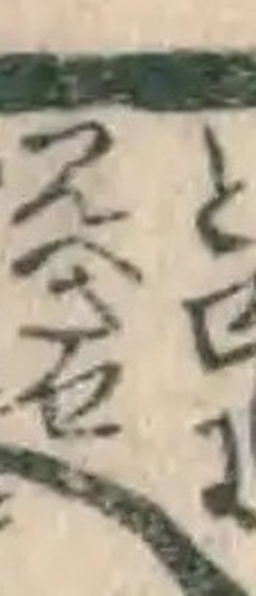見へさせ
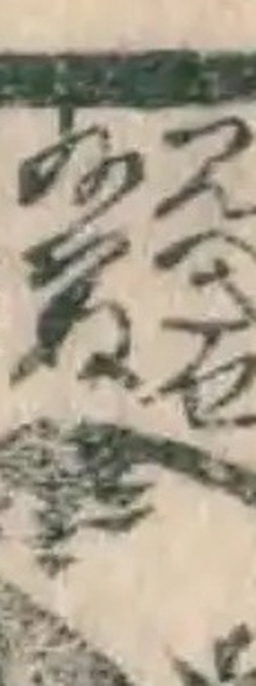給はぬ
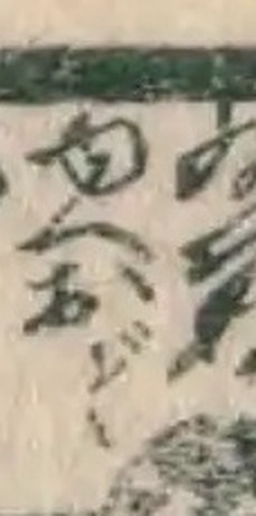ゆへおど
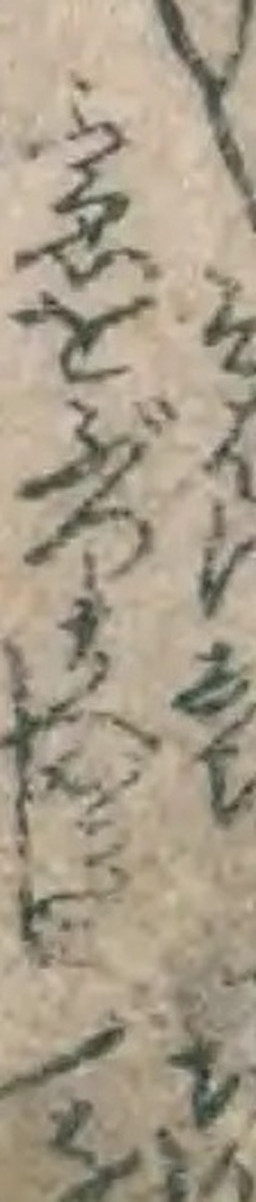ふゑをぶつまへおきしを
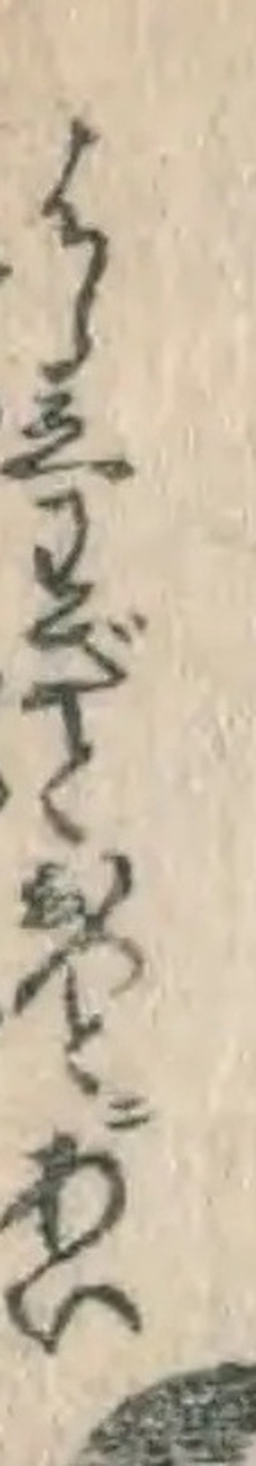はし立わざとおつとにあい
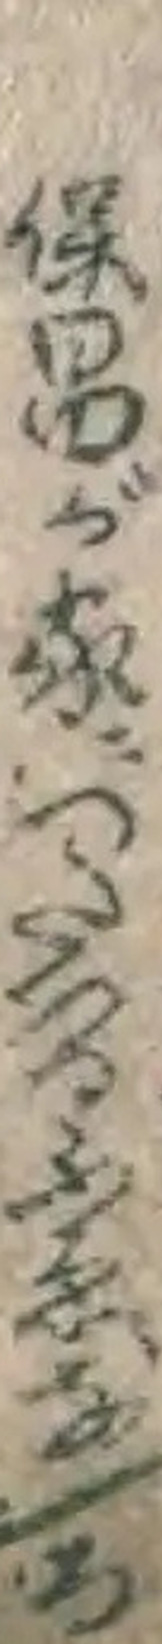保昌が家につたわるふゑなる
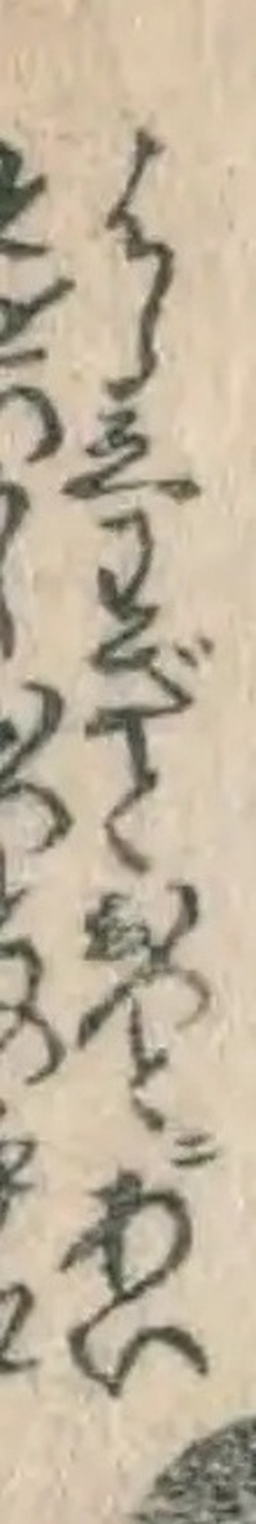はし立わざとおつとにあい
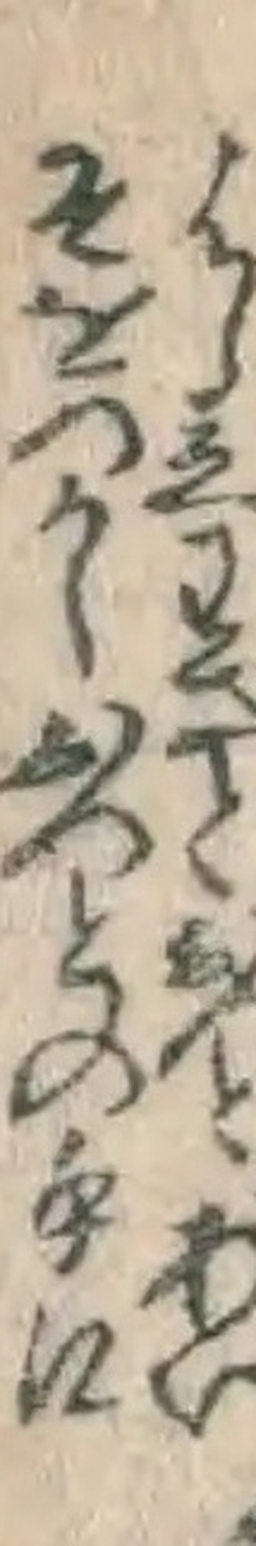そをつかしおつとの手に
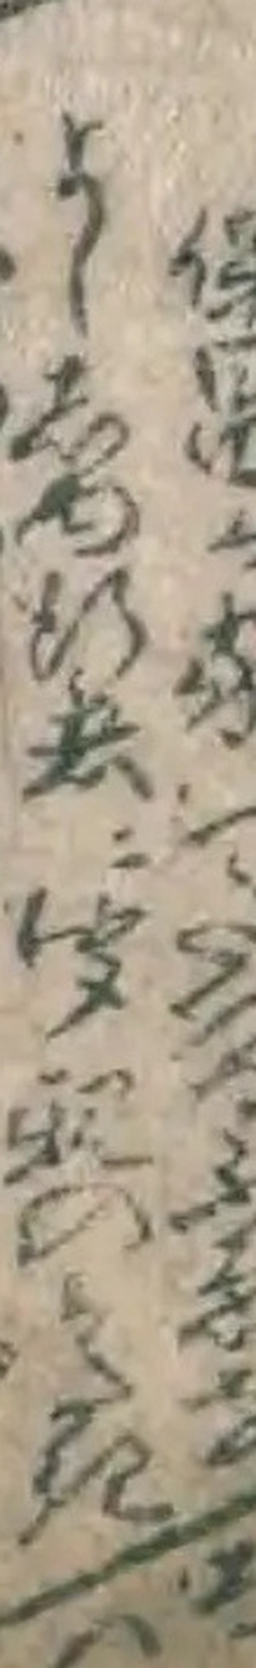よししゆ行者に聞親のかたきは
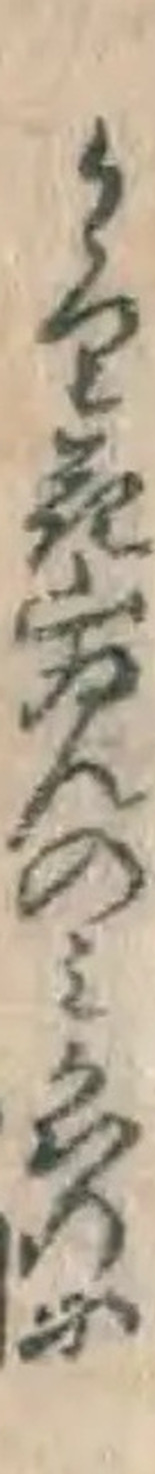かゝり花山ゐんのみかはりに
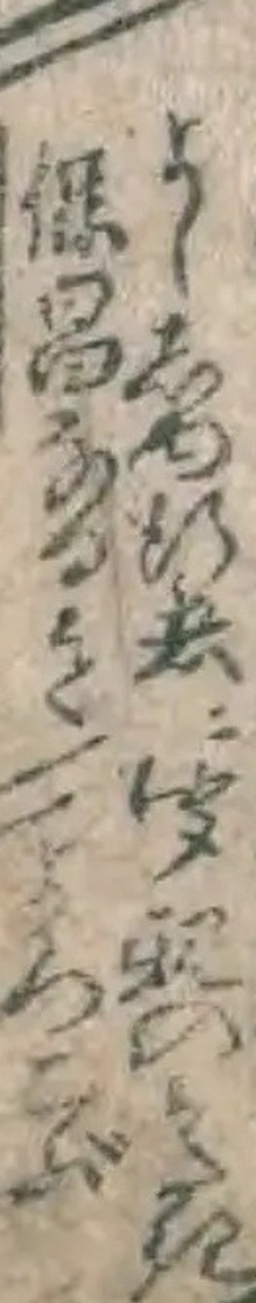保昌なるをよろこぶ
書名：四天王宿直着綿
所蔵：国立国会図書館 National Diet Library, JAPAN
